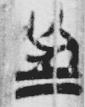爲
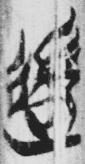後
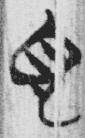見
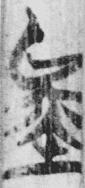○（舜）
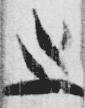之
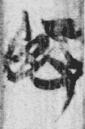臤（賢）
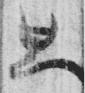也
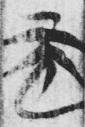而
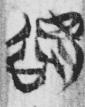欲
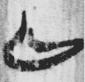㠯（以）
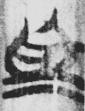爲
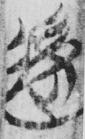後
